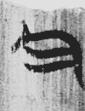今
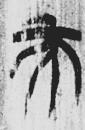天
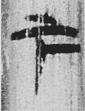下
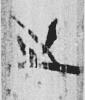之
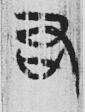君
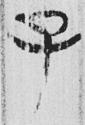子
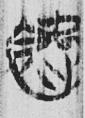既
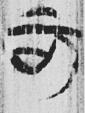可
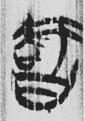智（知）
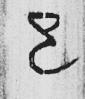已
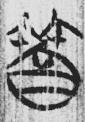○（孰）
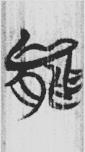能
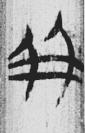并
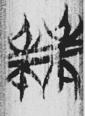兼
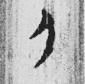人
